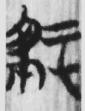○（冢）
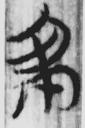○（豕）
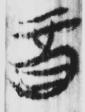酉（酒）
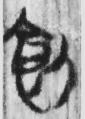○（食）
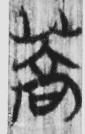蒿
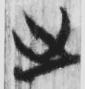之
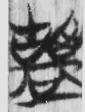○（盬）
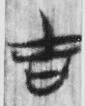吉
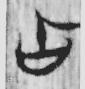占
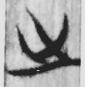之
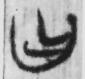曰
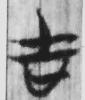吉
